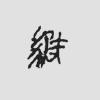{糸售}
